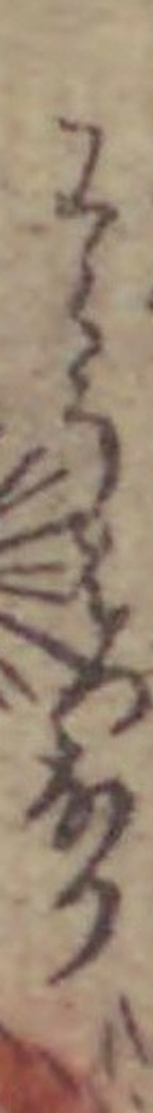わらうはづなり
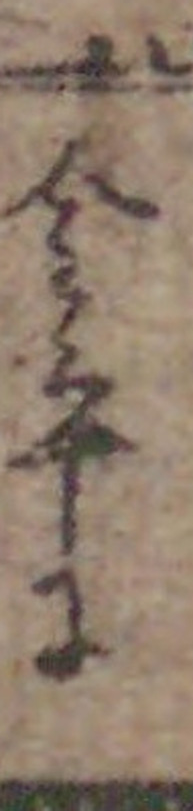金平に
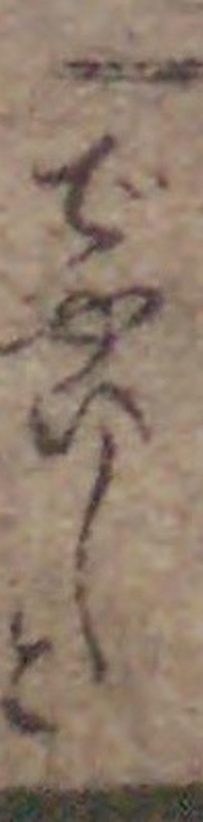でやいしと

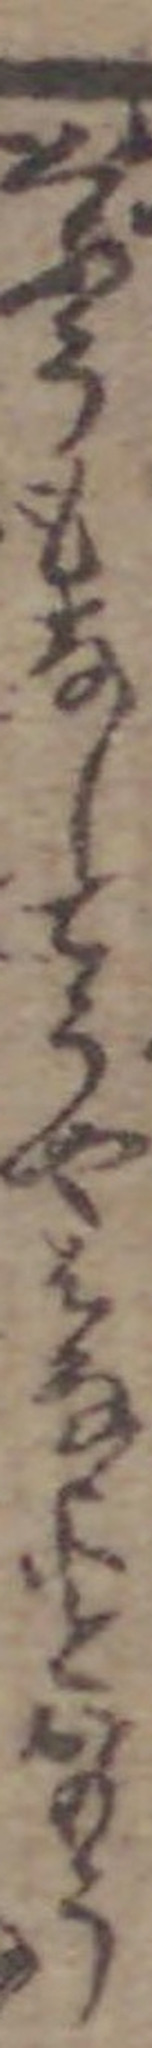くふうもなしてうやはなよとおもう
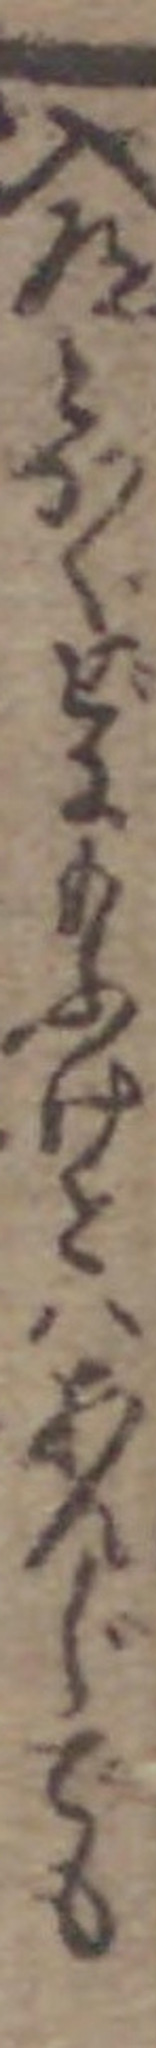入道とかくぜにもふけをあんじても
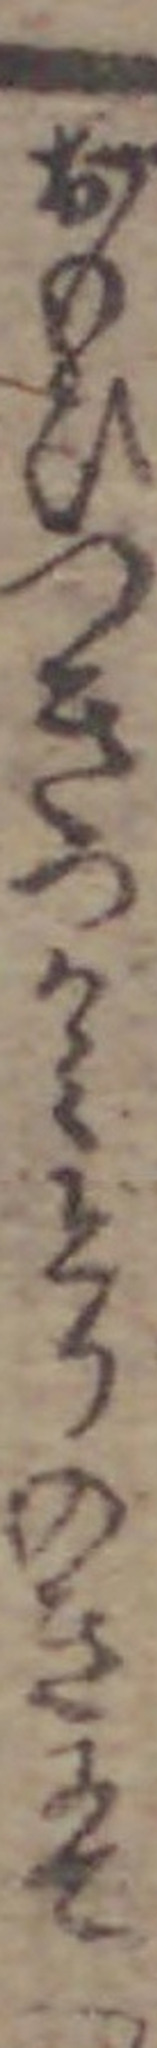おもひつきつかみどりのきにて
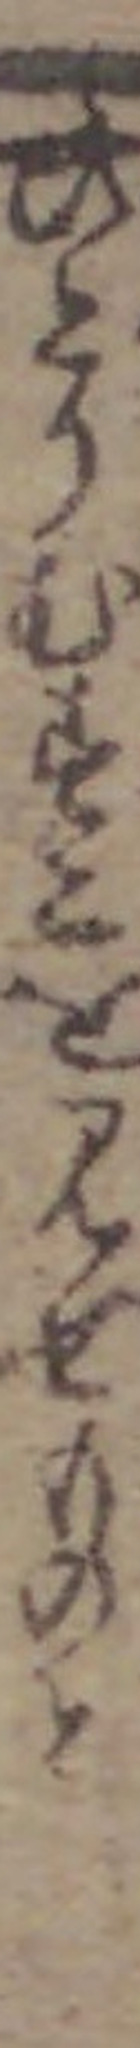ひとりむすこをみせものと
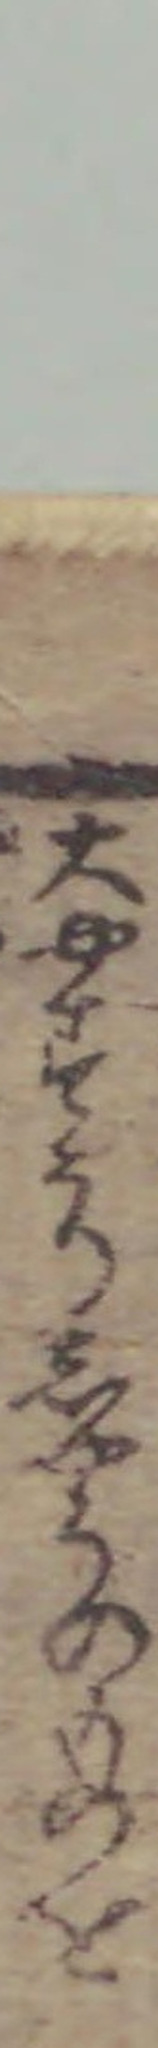大やすうりしやうのものを
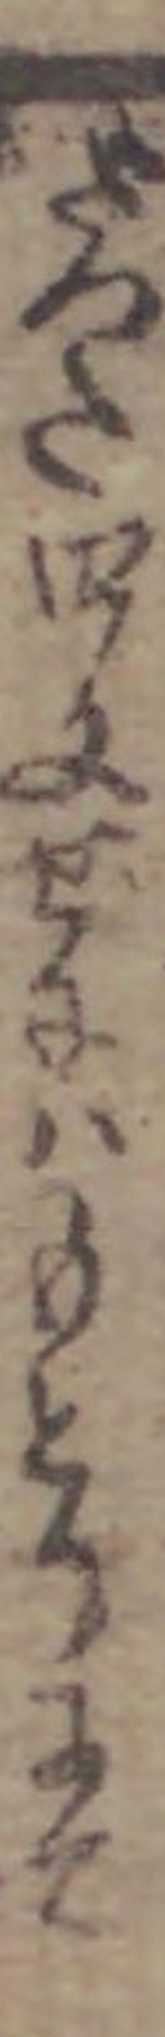たつた四文ぜにはもとりにて
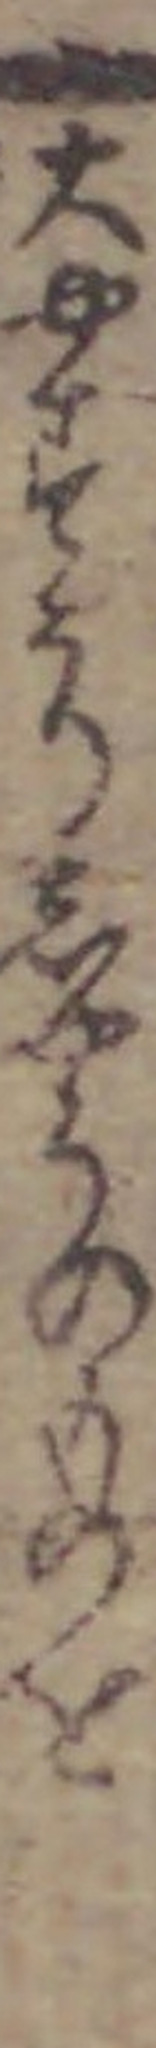大やすうりしやうのものを
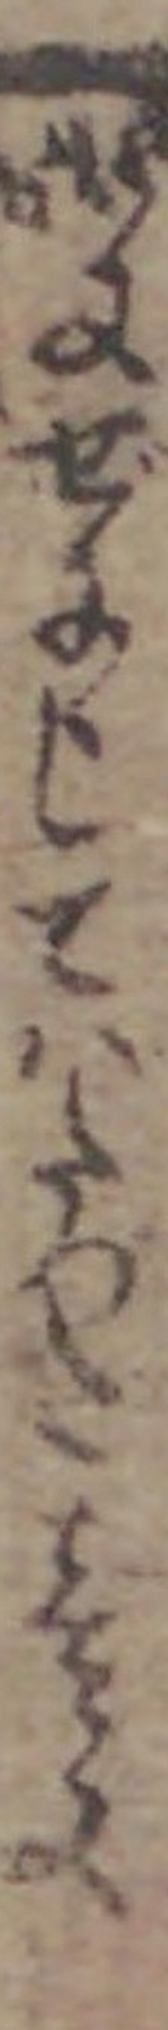文ぜにゝしてはたつた壹文
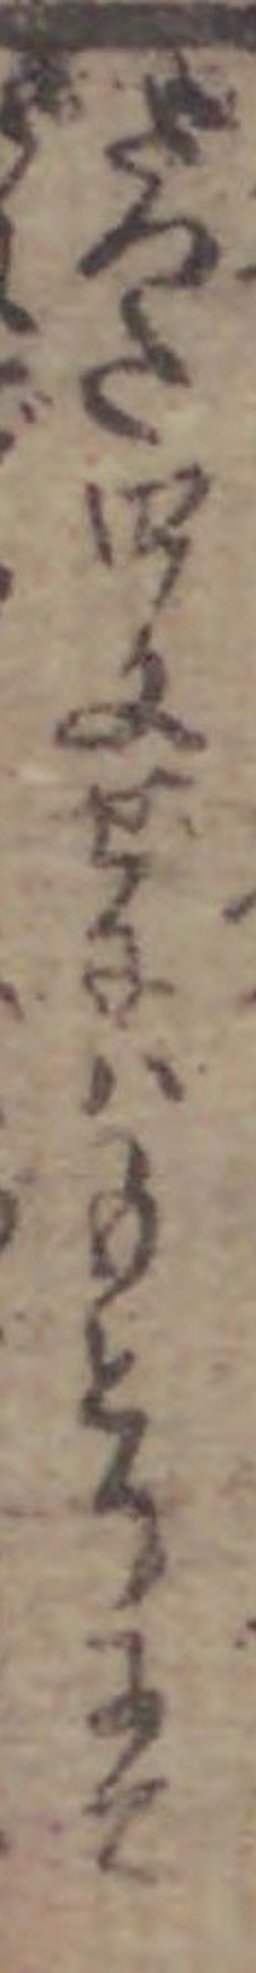たつた四文ぜにはもとりにて
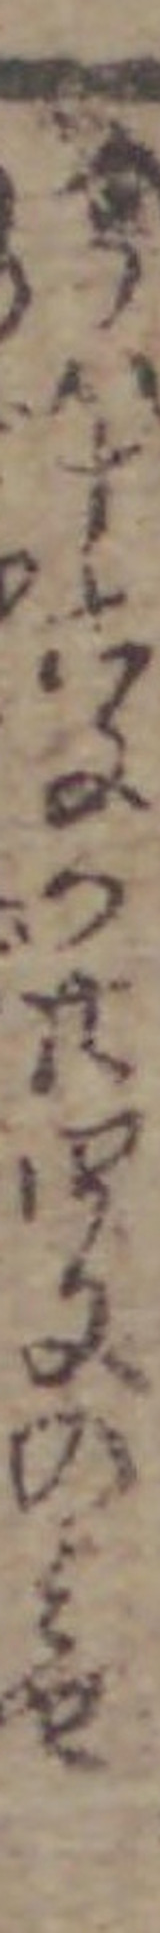今は十六文か廿四文のみせ
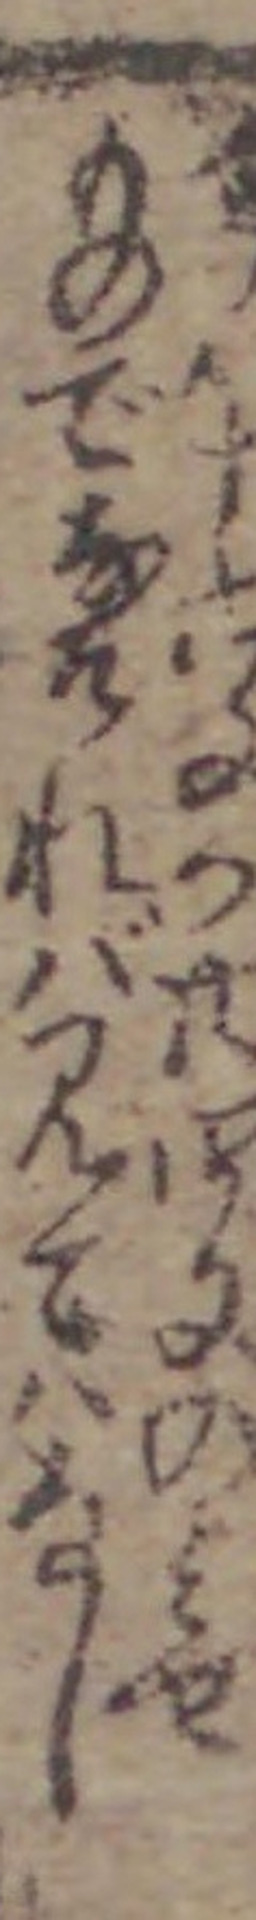ものでなければみてはなし
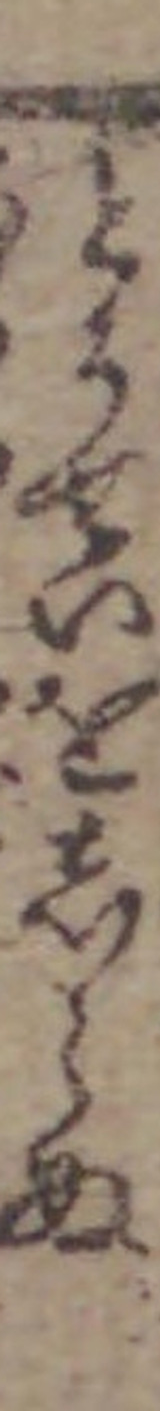とうせいをしらぬ
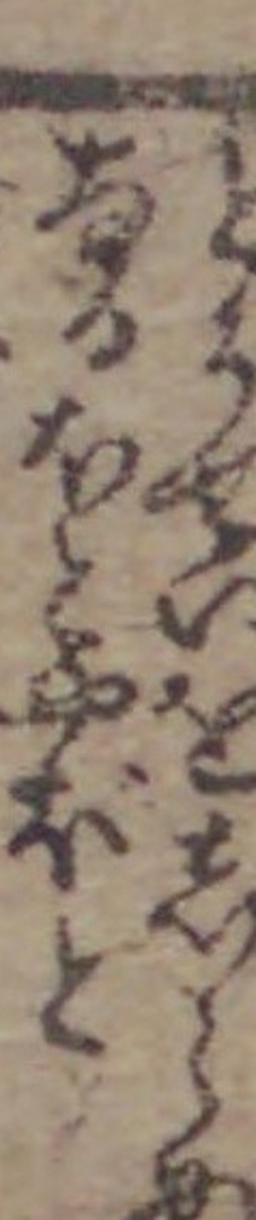なるほとやぼと
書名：化物鼻がひしげ 2巻
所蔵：国立国会図書館 National Diet Library, JAPAN
